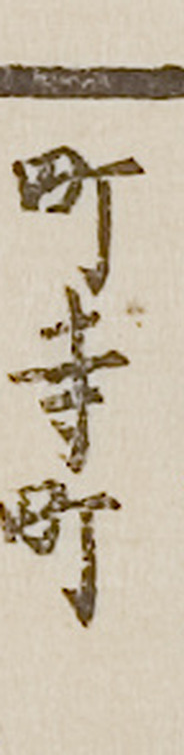町寺町
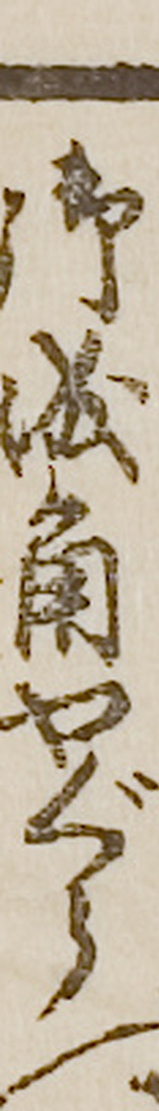御城角やぐら
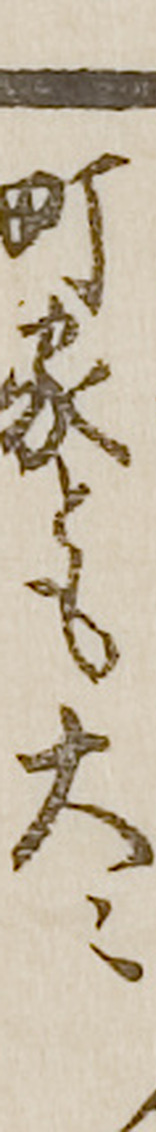町家とも大に
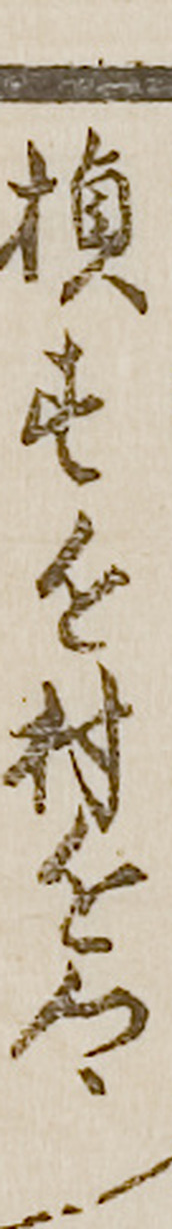損す近村近郷
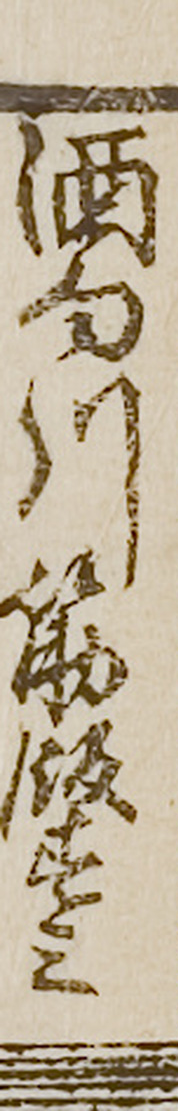酒匂川筋飯すみ
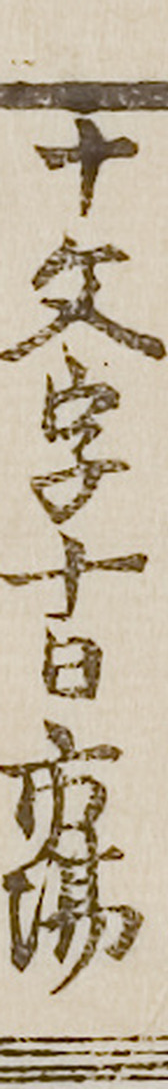十文字十日市場
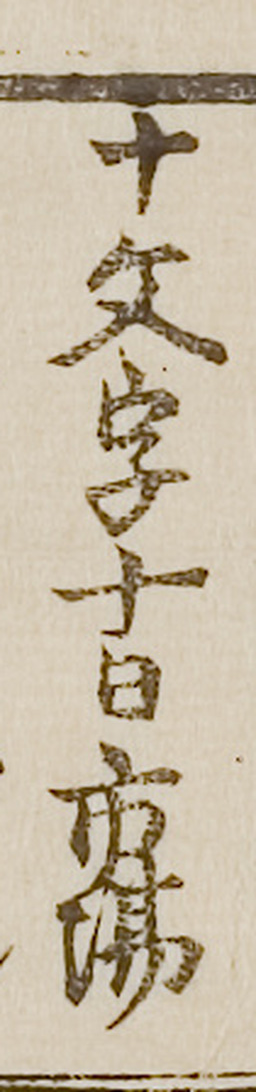十文字十日市場
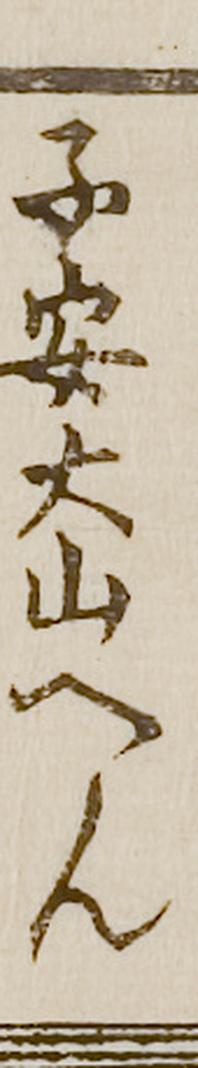子安大山へん
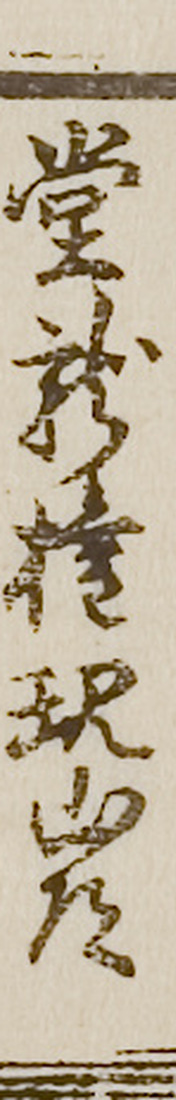堂新権現山道
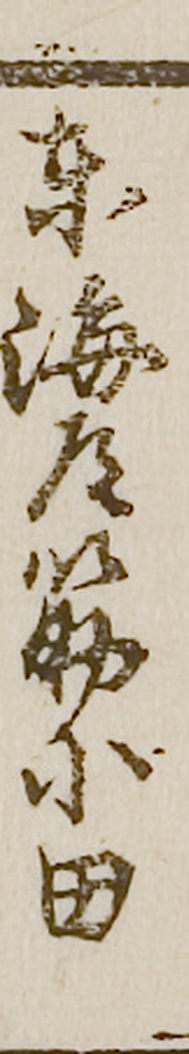東海道筋小田
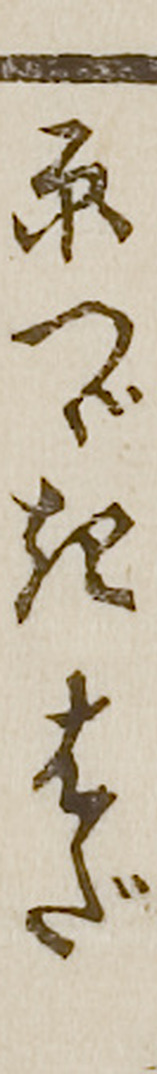原つゞきはだ
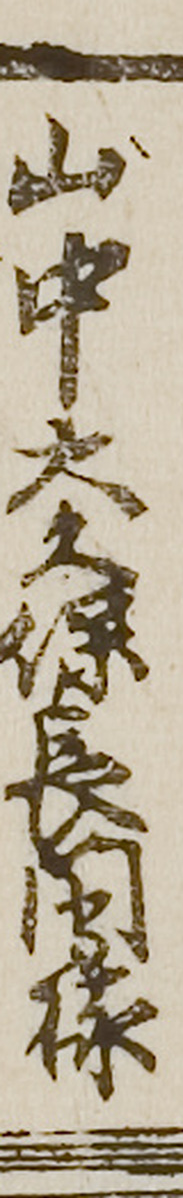山中大久保長門守様
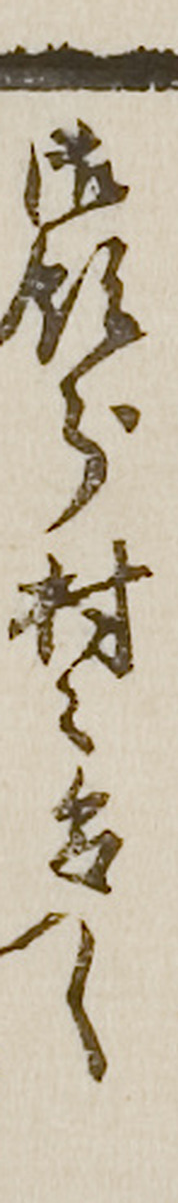御領分村々多く
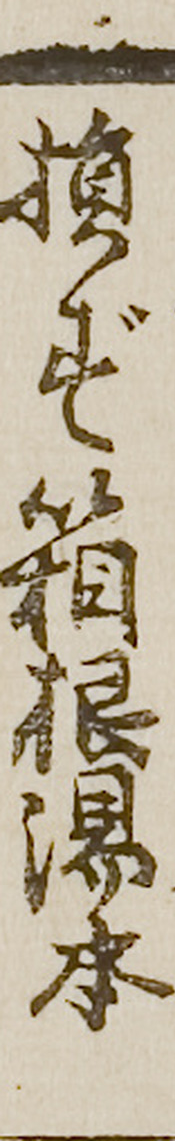損ず箱根湯本
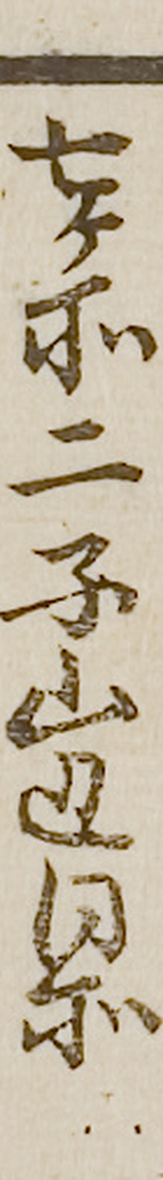七ケ所二子山辺同所
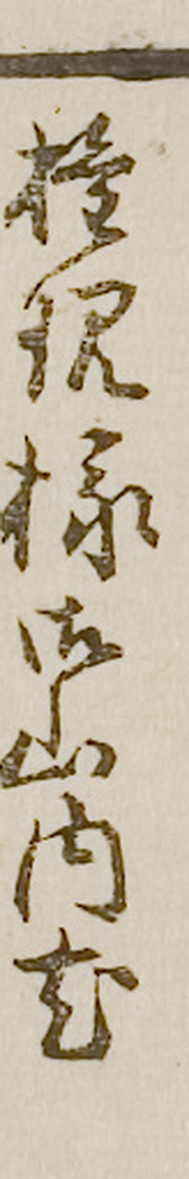権現様御山内尤
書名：出方山おしぬけ
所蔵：東京大学総合図書館 General Library in the University of Tokyo, JAPAN
